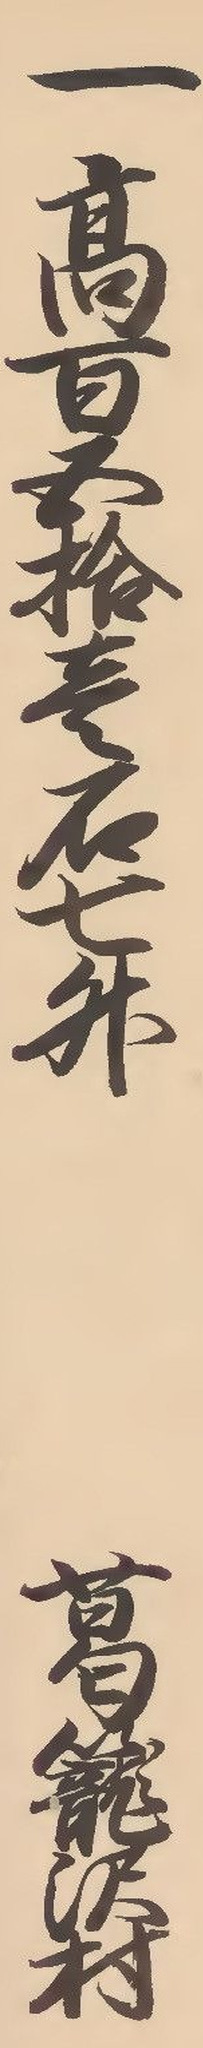一高百五拾壱石七升葛籠沢村
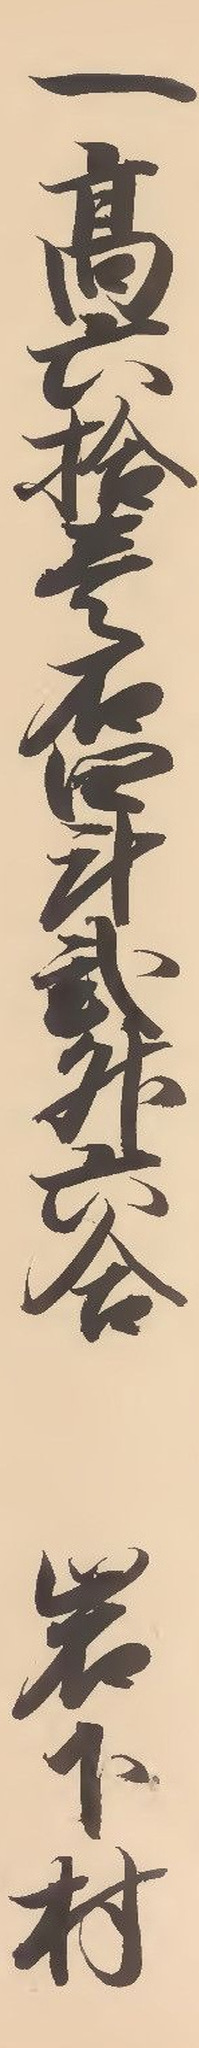一高六拾壱石四斗弐升六合岩下村
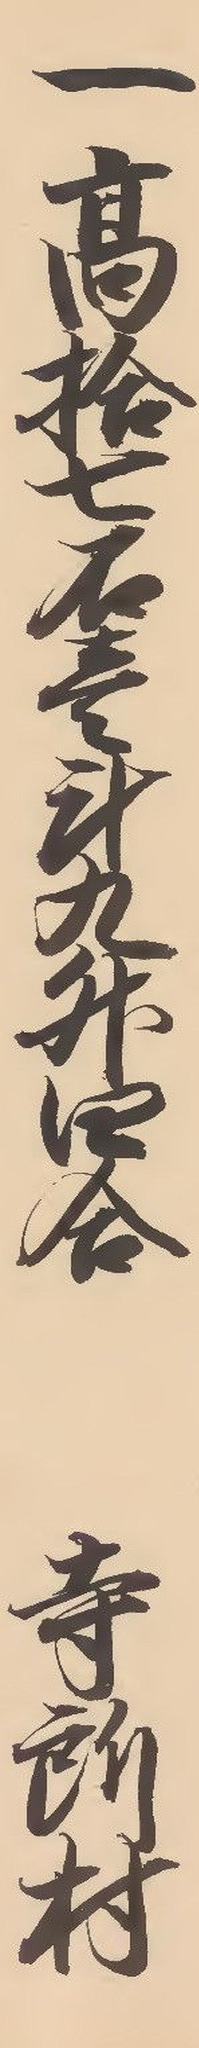一高拾七石壱斗九升四合寺所村
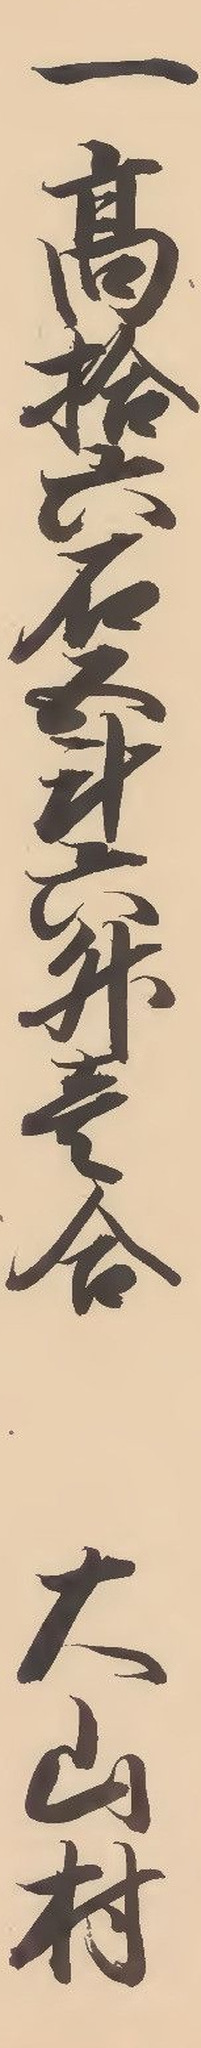一高拾六石五斗六升壱合大山村
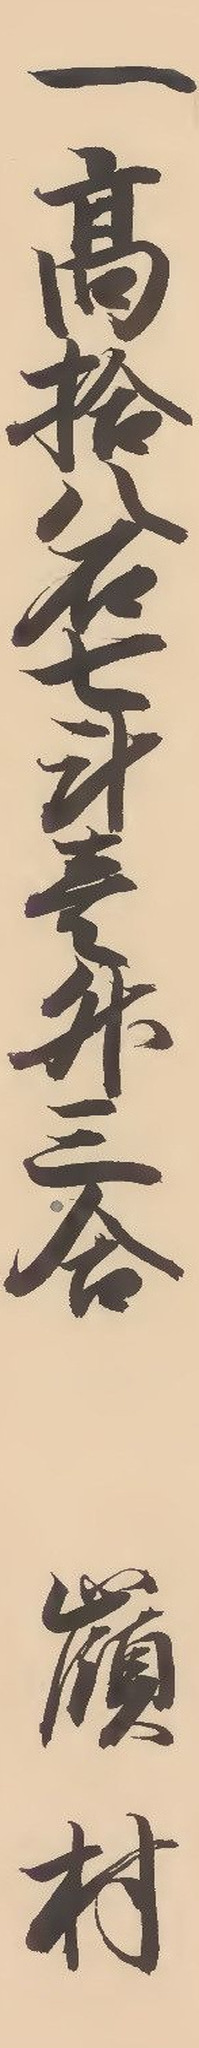一高拾八石七斗壱升三合嶺村

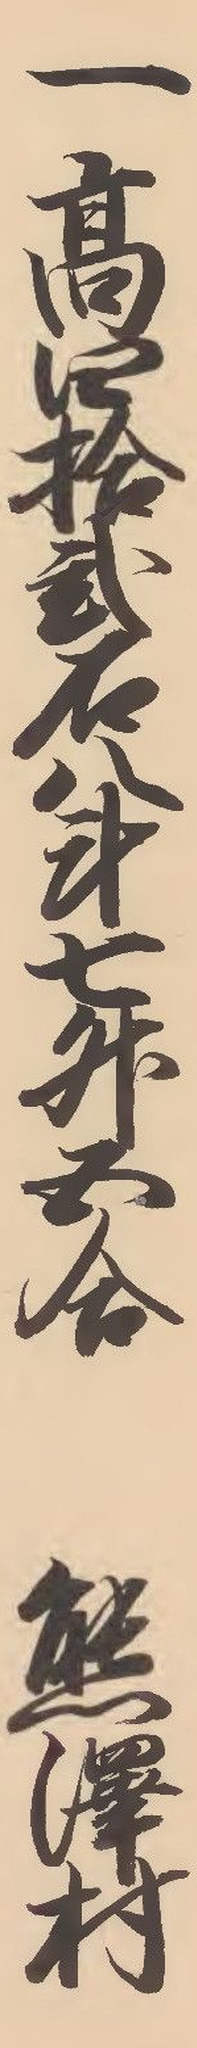一高四拾弐石八斗七升五合熊沢村
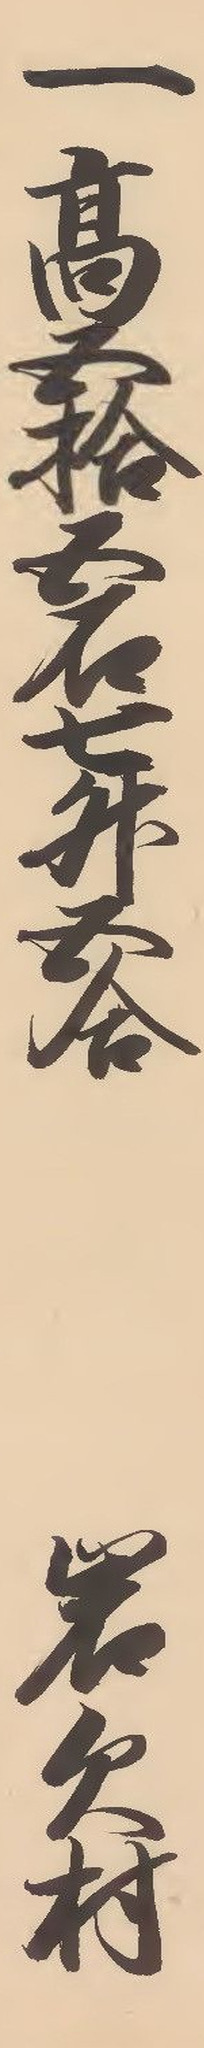一高五拾五石七升五合岩欠村
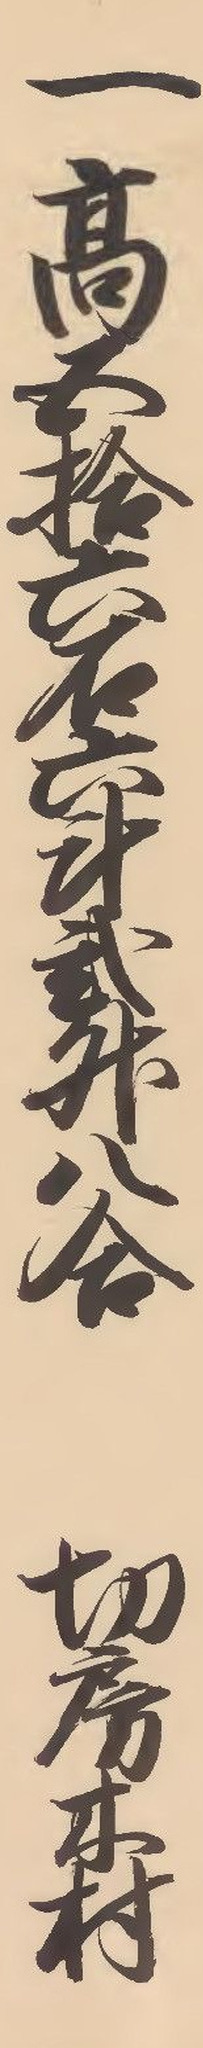一高五拾六石六斗弐升八合切房木村
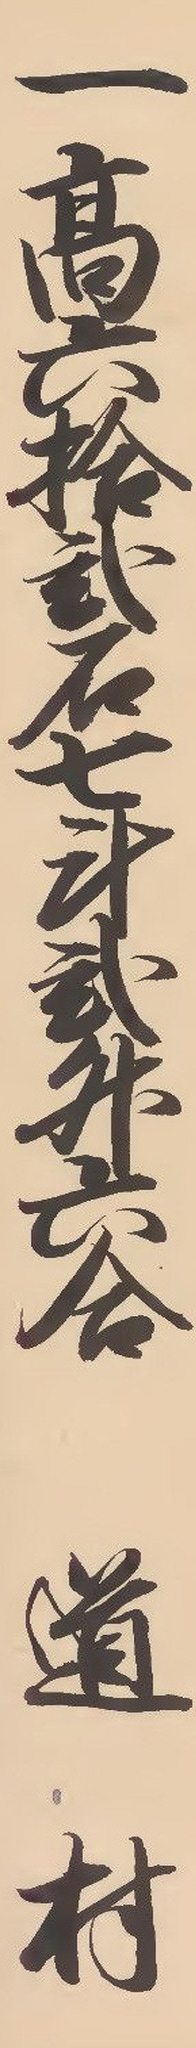一高六拾弐石七斗弐升六合道村
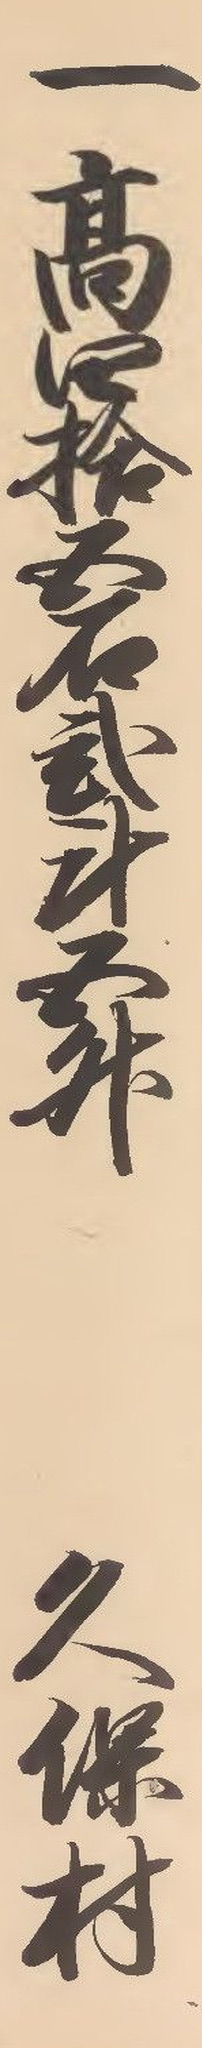一高四拾五石弐斗五升久保村
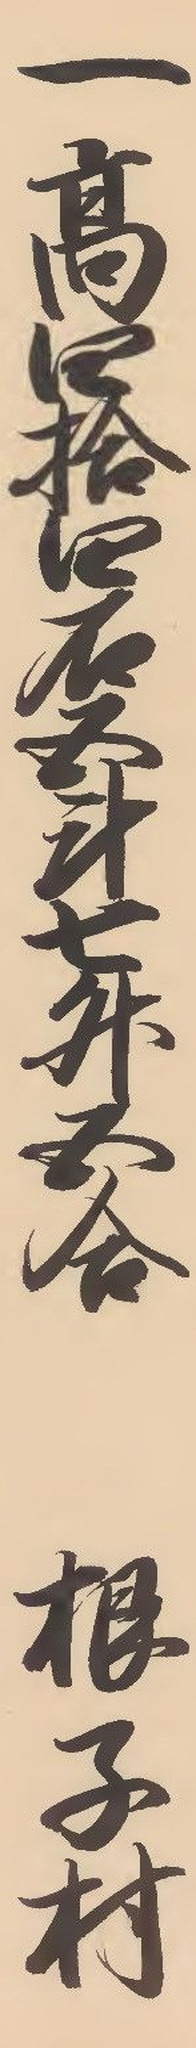一高四拾四石五斗七升五合根子村
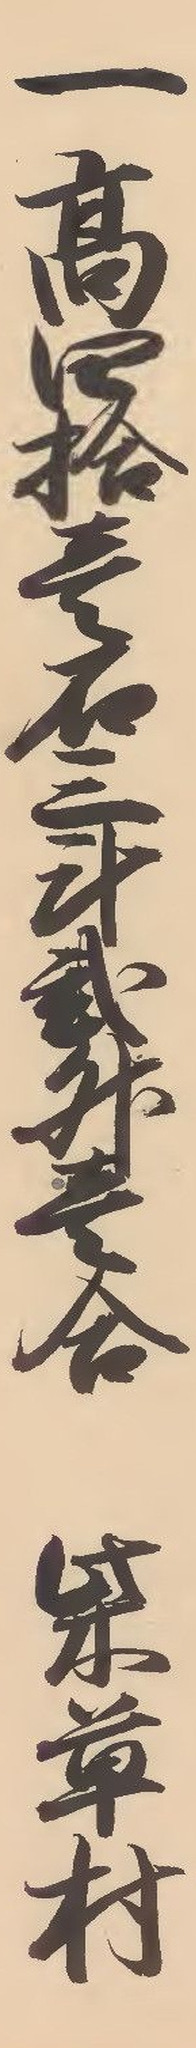一高四拾壱石三斗弐升壱合柴草村

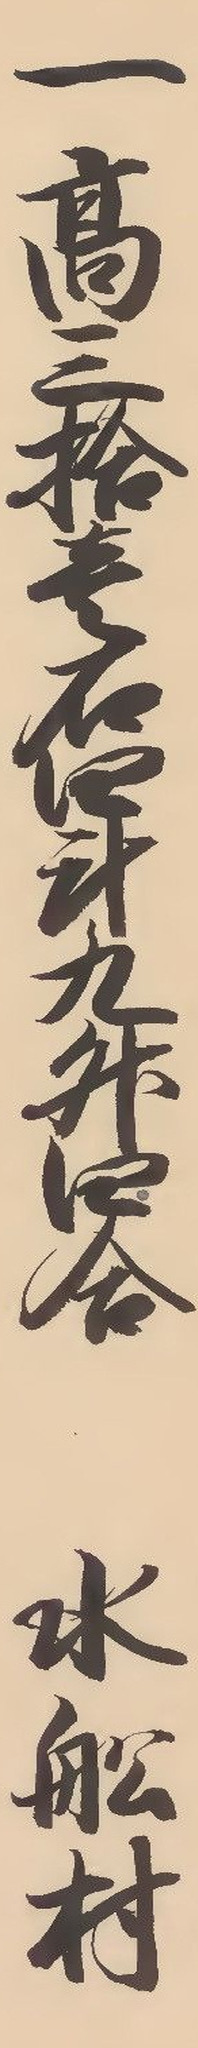一高三拾壱石四斗九升四合水船村
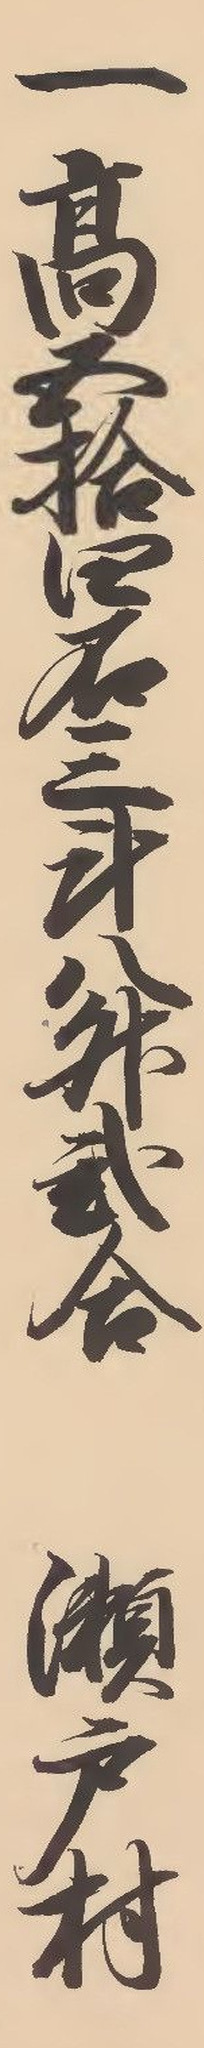一高五拾四石三斗八升弐合瀬戸村
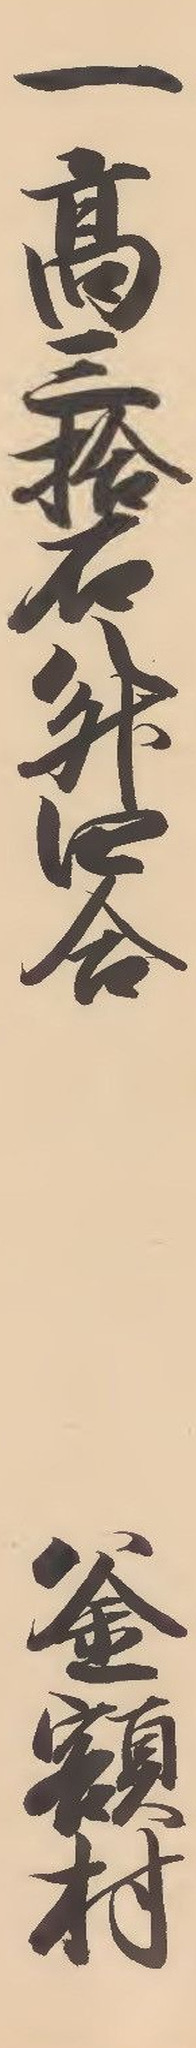一高三拾石八升四合釜額村
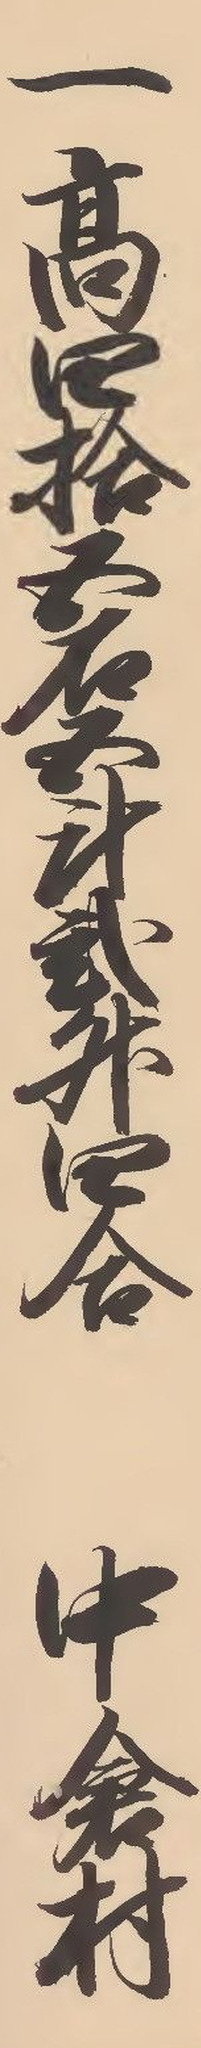一高四拾五石五斗弐升四合中倉村
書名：甲斐国郷帳
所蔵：国立公文書館 National Archives of Japan
